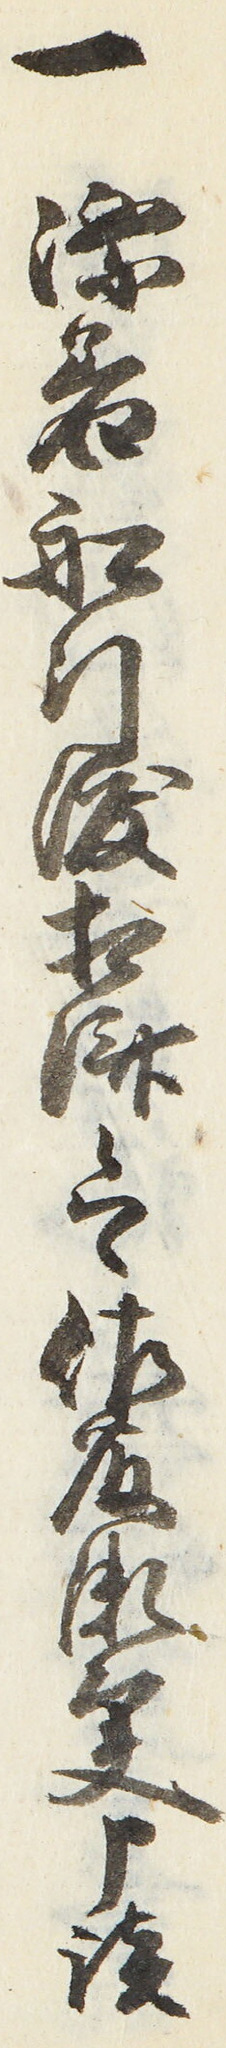一漂着船引渡相済候ハヽ佐藤瀬大夫申談
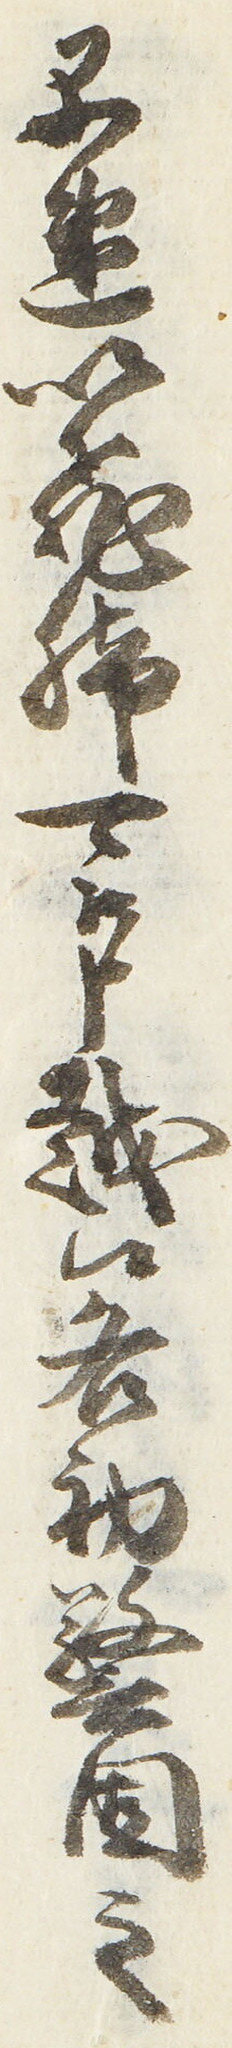早速以飛脚可被申越候各初警固之
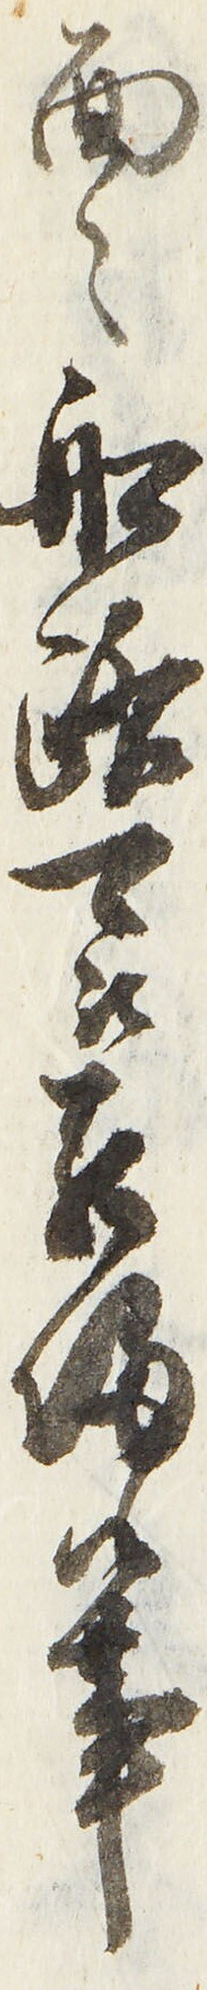面々船路可被罷帰候事
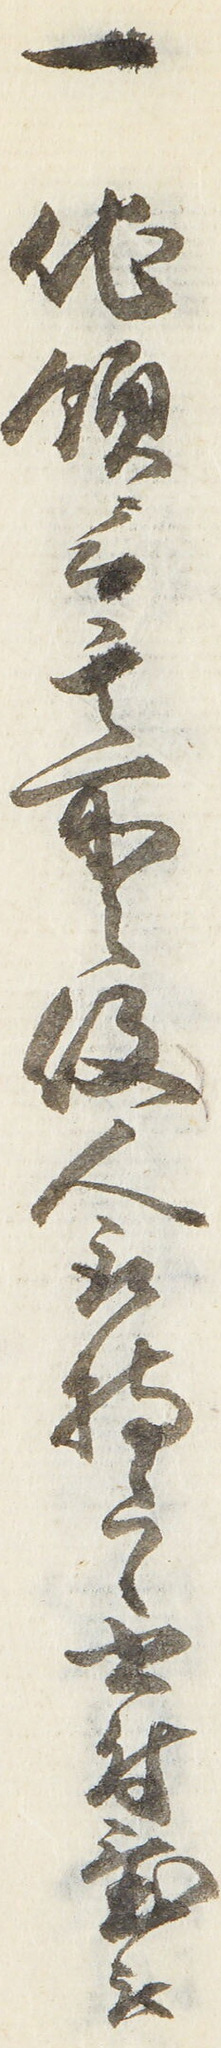一他領ニ而其所之役人取持候ハヽ書付置被
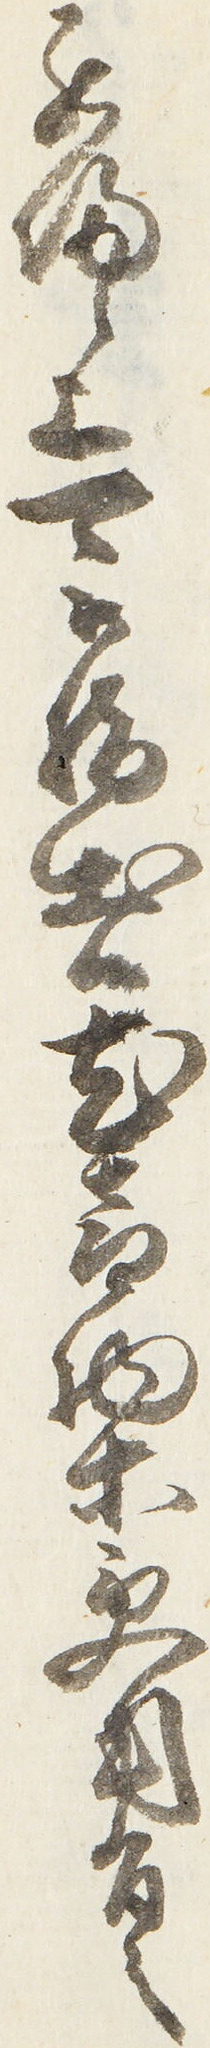罷帰候上可被指出候尤音物等受用有之
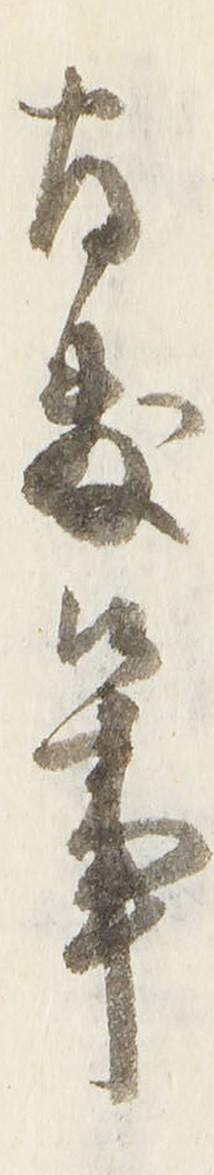間敷候事
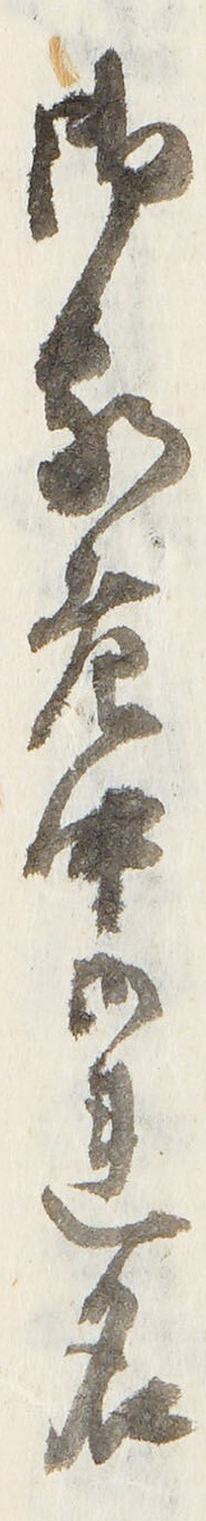御家老中御連名
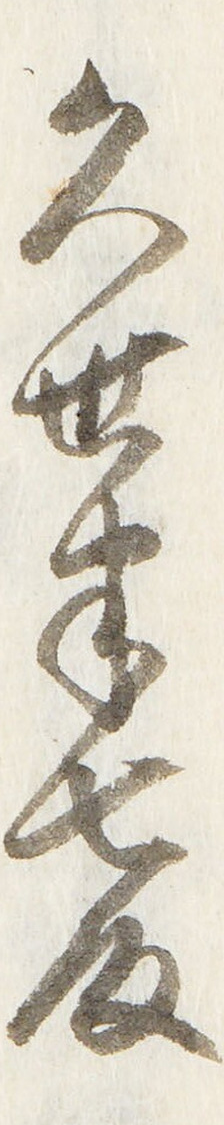久世半七殿
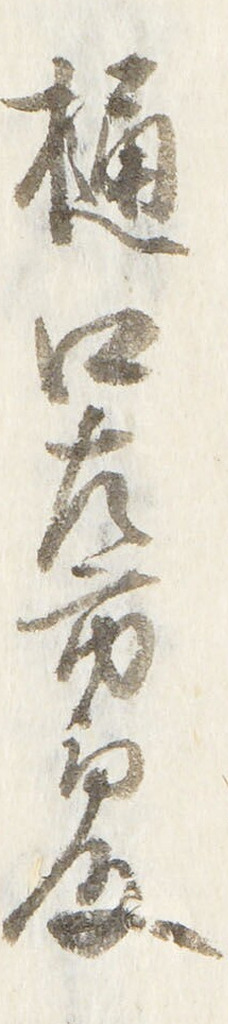樋口左市郎殿
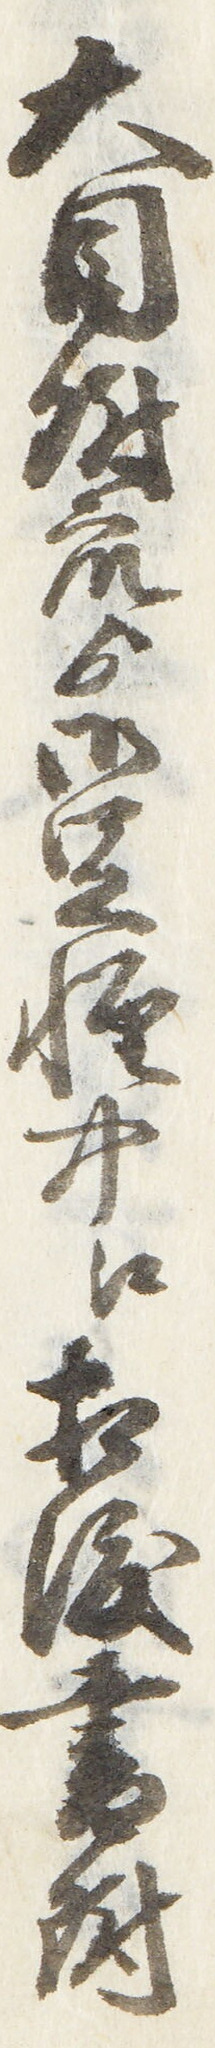大目付衆ゟ御足軽中江相渡書付
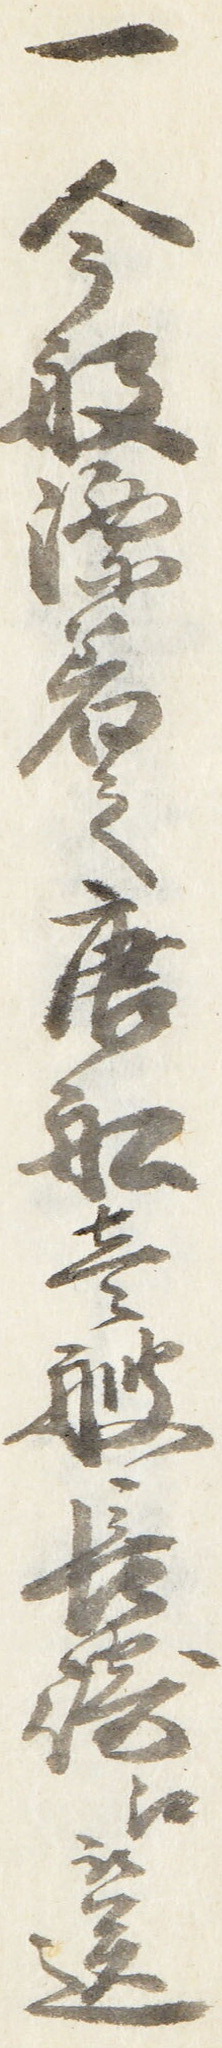一今般漂着之唐船壱艘長崎江被送
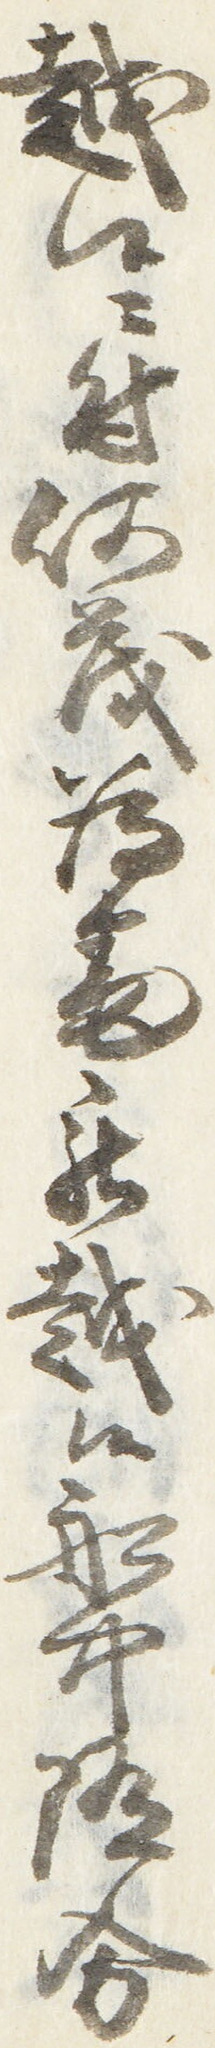越候ニ付何も為番罷越候船中随分
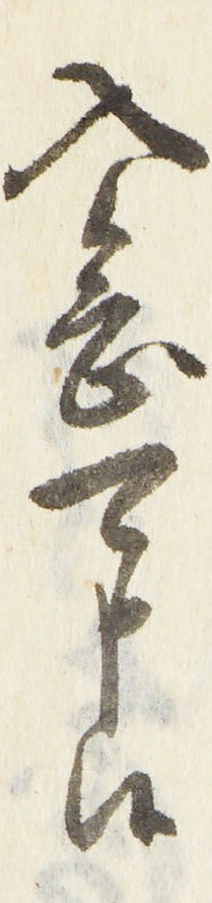入念可申候

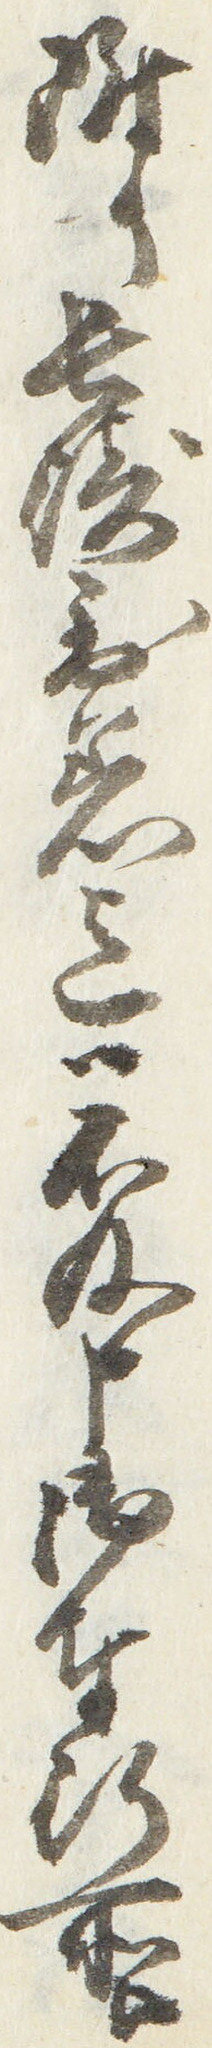付り長崎到着迄ハ不及申御奉行所江
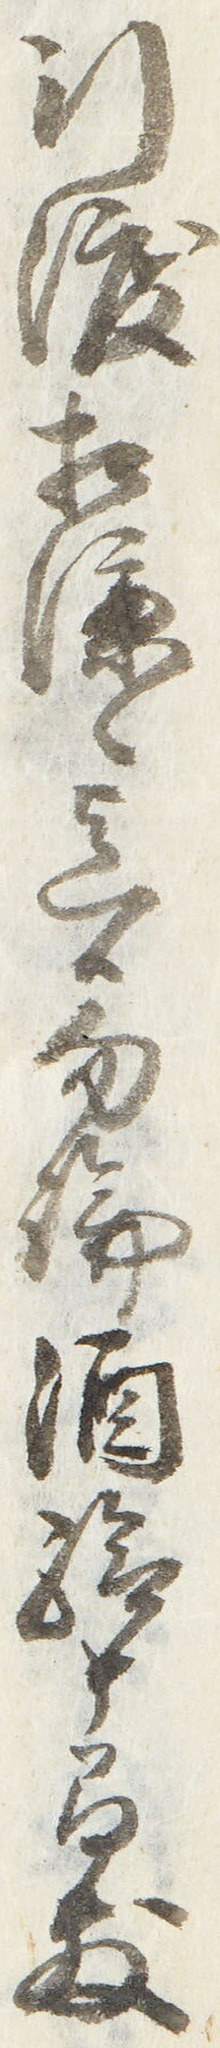引渡相済候迄ハ勿論酒給申間敷
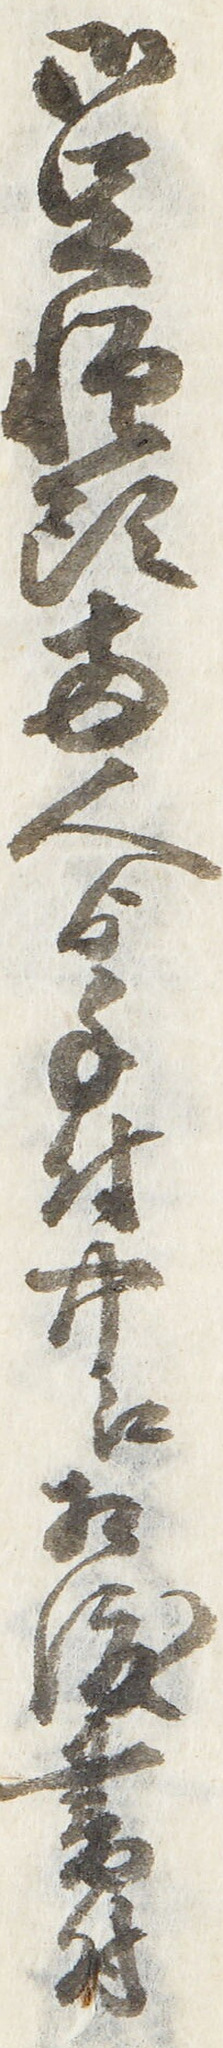御足軽頭両人ゟ手付中江相渡書付
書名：玄海嶋江漂着船為警固長崎江被越候覚
